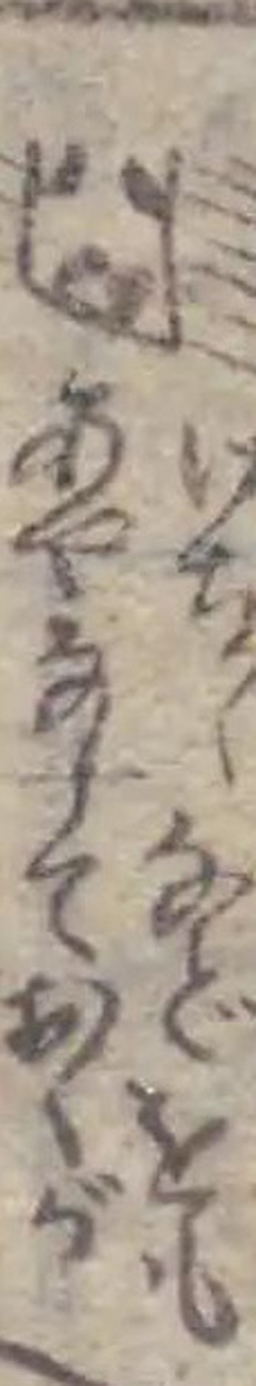あやなしておくが
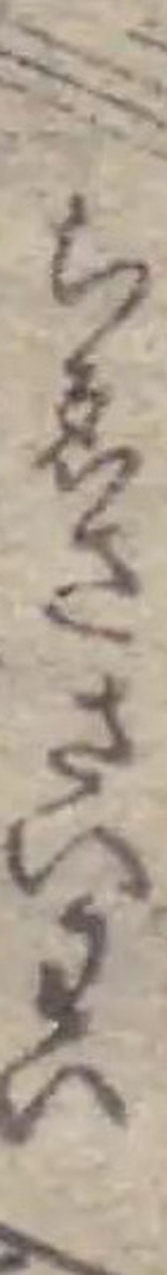ちゑささいわい
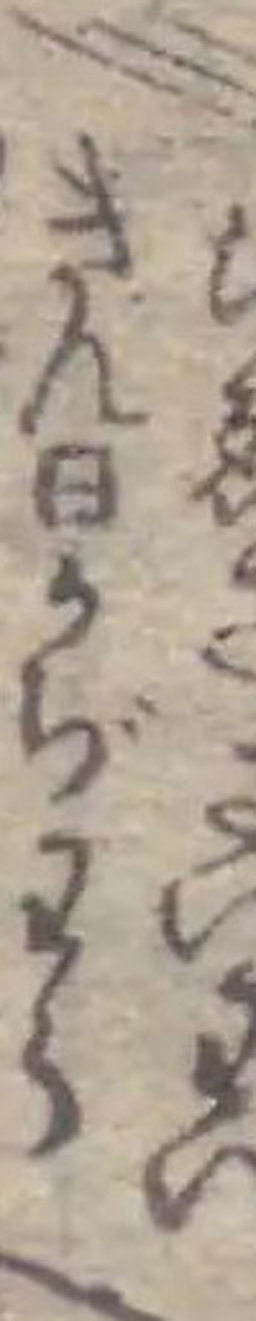きん日かぢわら
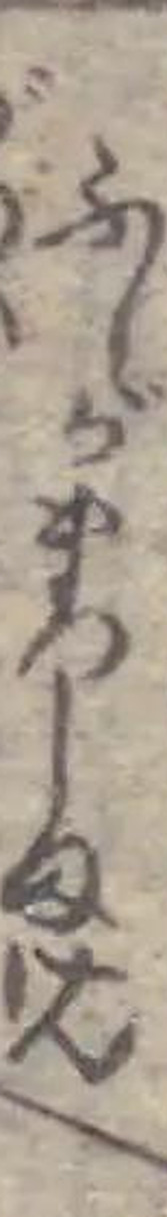ふしがまつしまけん
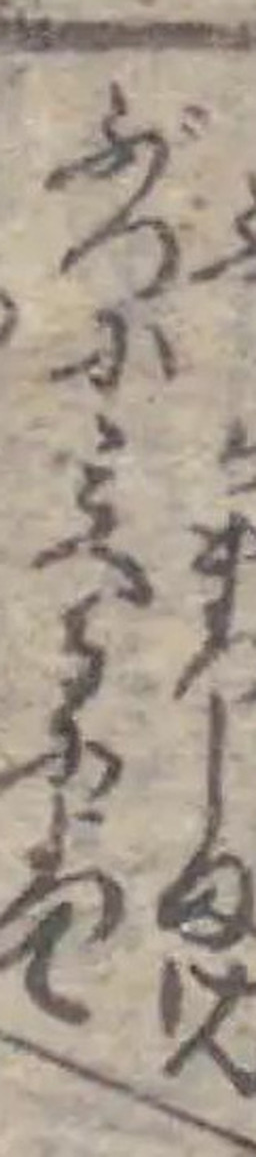ぶつにみへるによつて
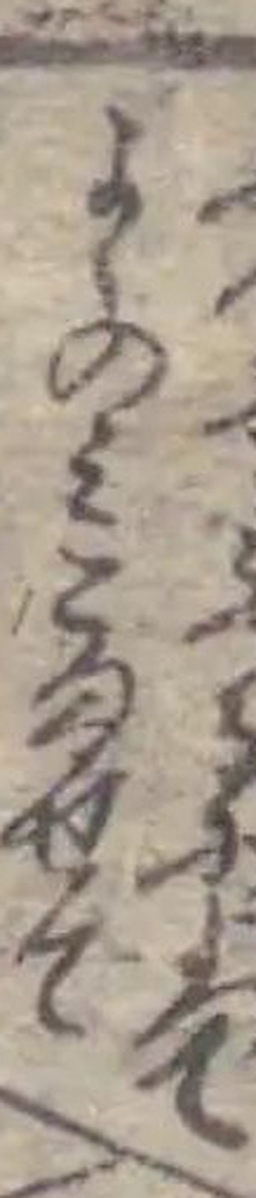よくのみこませて
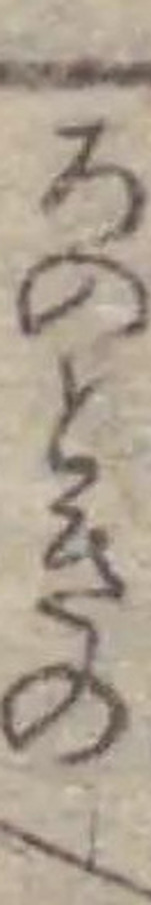ろのときの
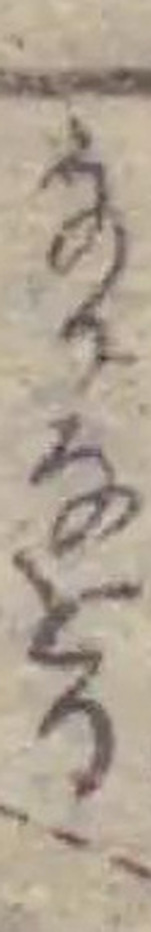なかなをり
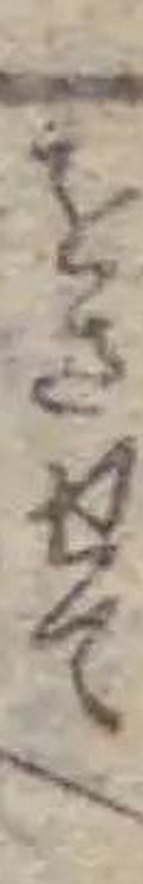をさせて
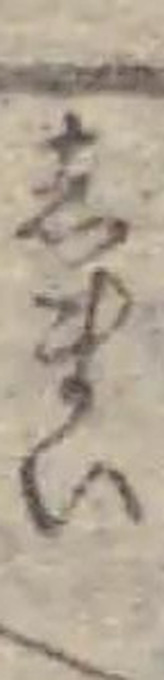しまい
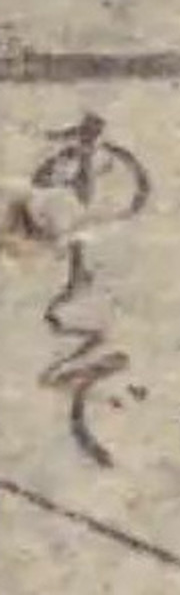あとで
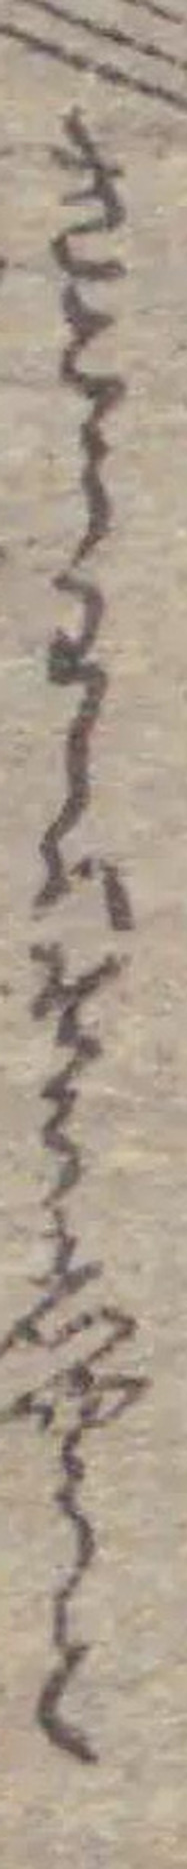きこうわしはそうしやうと
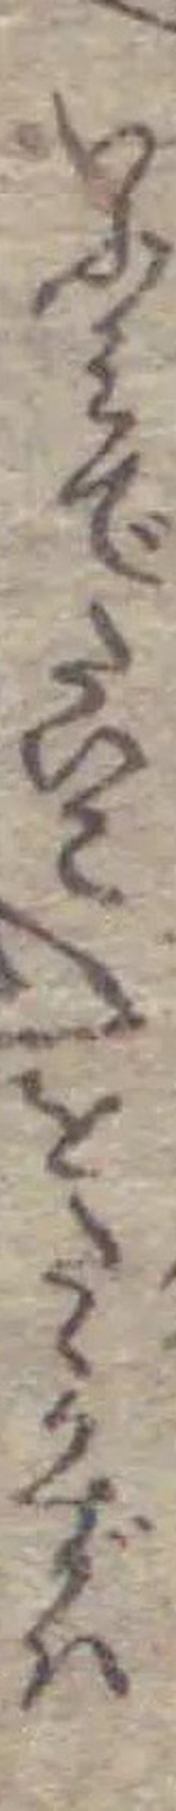いふみでたいこをたゝかずは
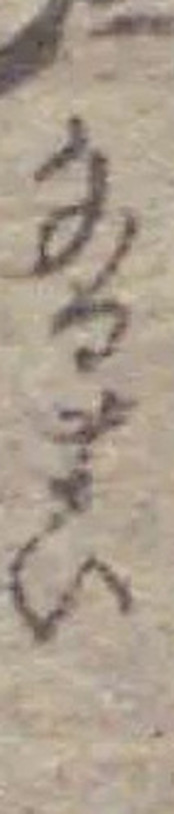なるまい
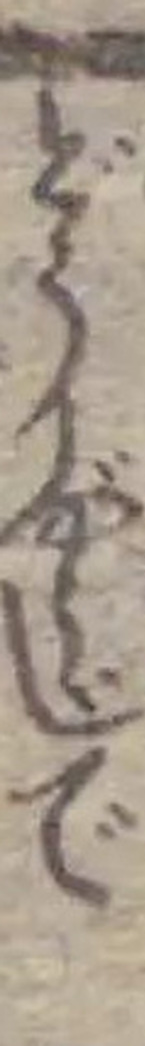どうりじやうじで
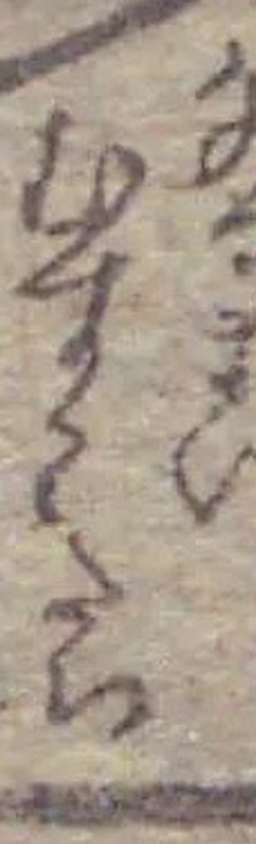むすこたち
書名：通増安宅関 2巻
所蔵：国立国会図書館 National Diet Library, JAPAN
